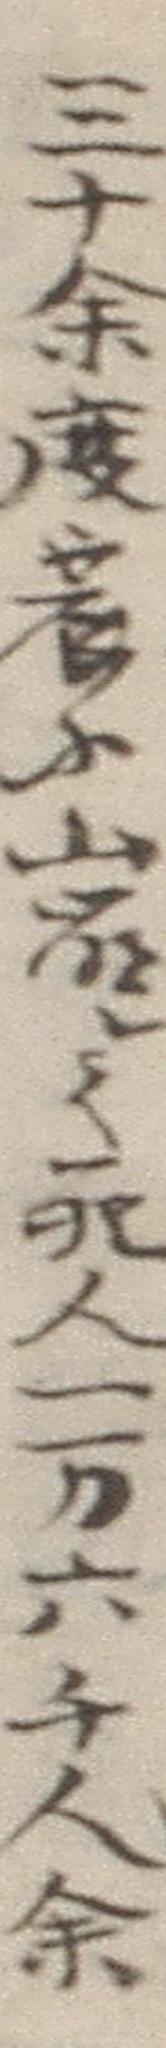三十余度震ふ山崩れて死人一万六千人余
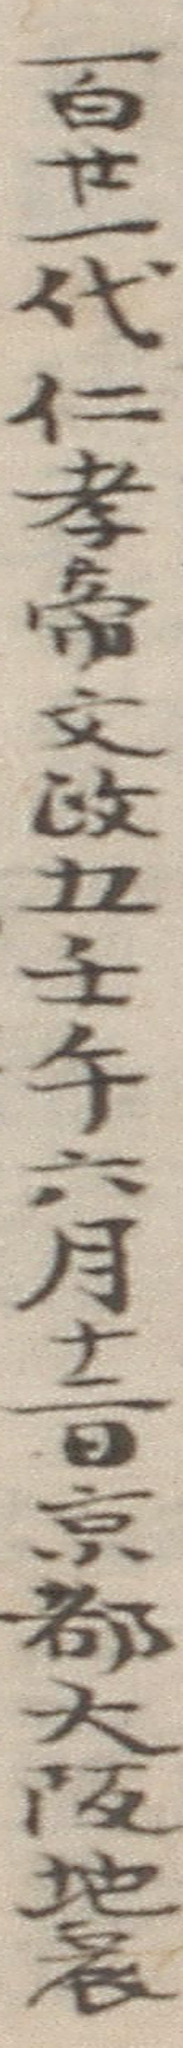百廿一代仁孝帝文政五壬午六月十二日京都大阪地震
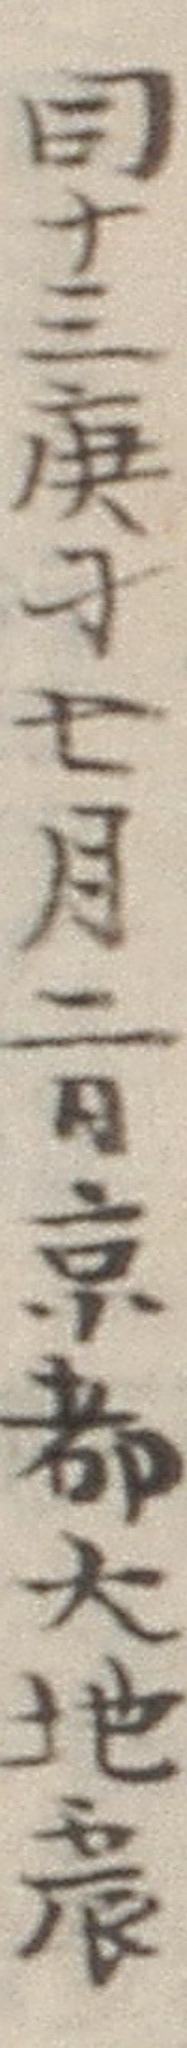同十三庚子七月二日京都大地震
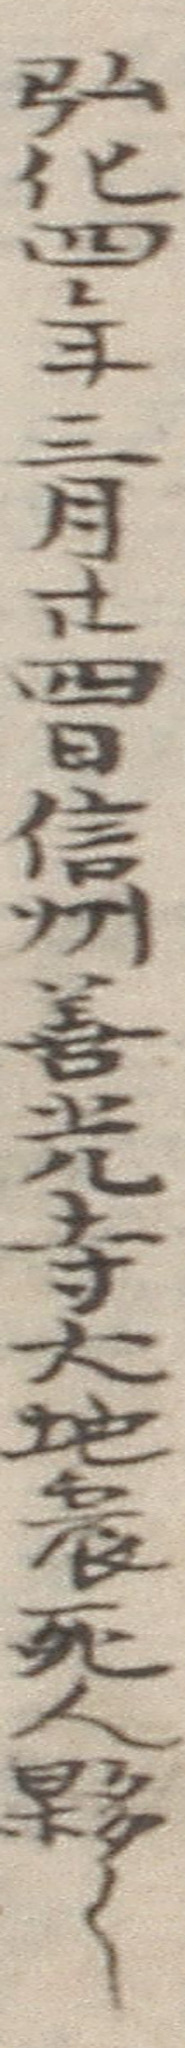弘文四年三月廿四日信州善光寺大地震死人夥し
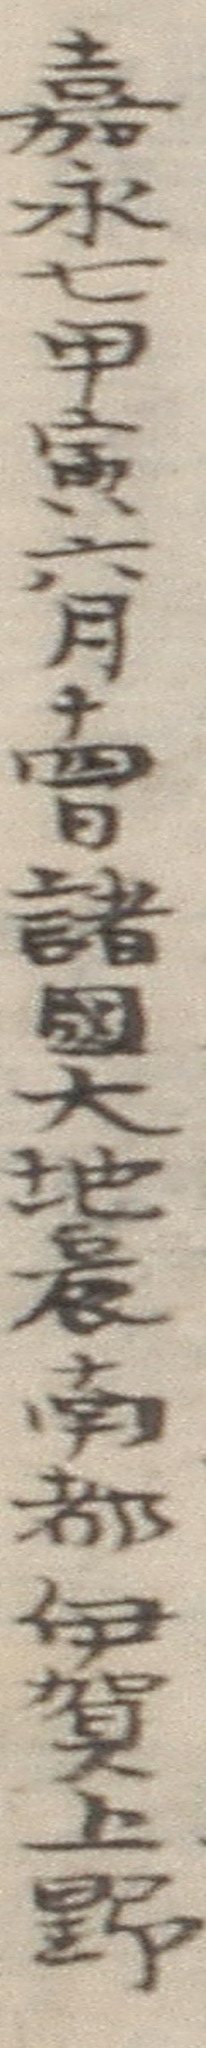嘉永七甲寅六月十四日諸國大地震南部伊賀上野
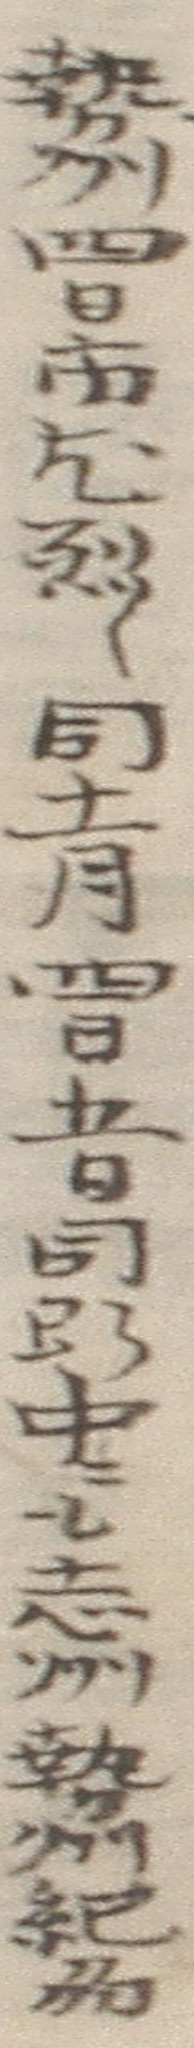勢州四日市尤烈し同十一月四日五日同所？中に志州勢州紀州
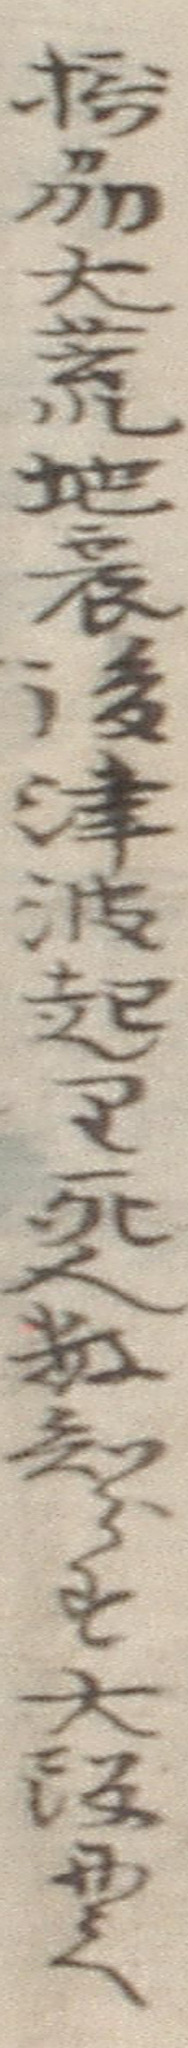摂州大荒地震後津波起り死人数しらす大阪にて
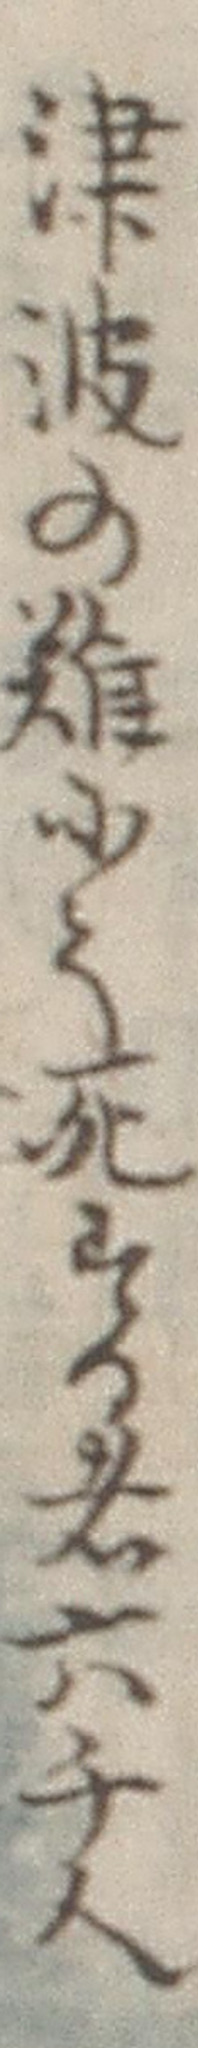津波の難にて死する者六千人

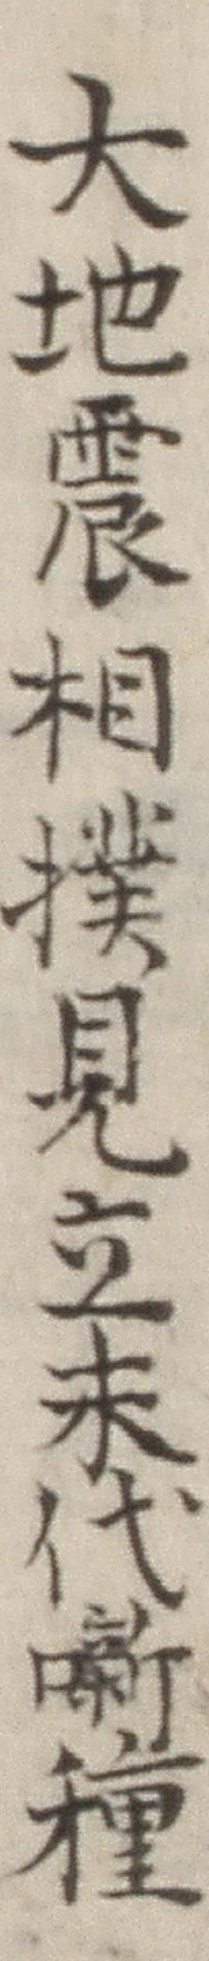大地震相撲見立未代噺種
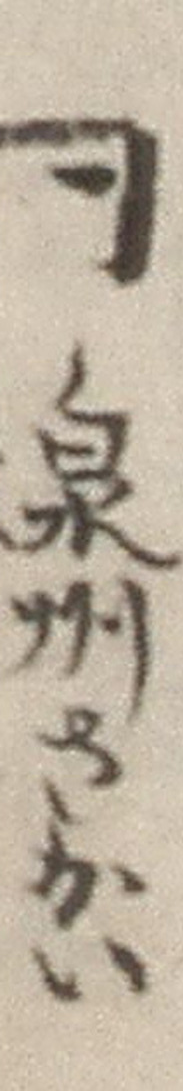同泉州さかい
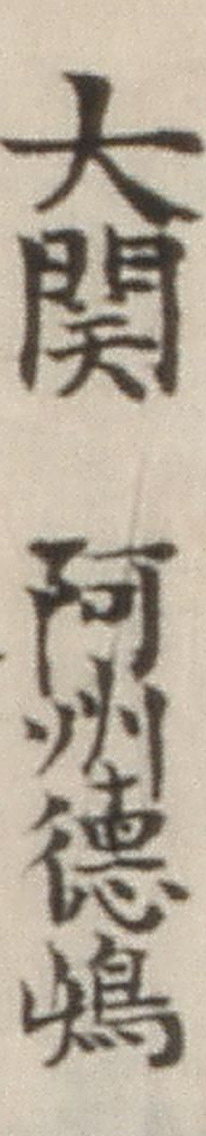大関阿州徳嶋
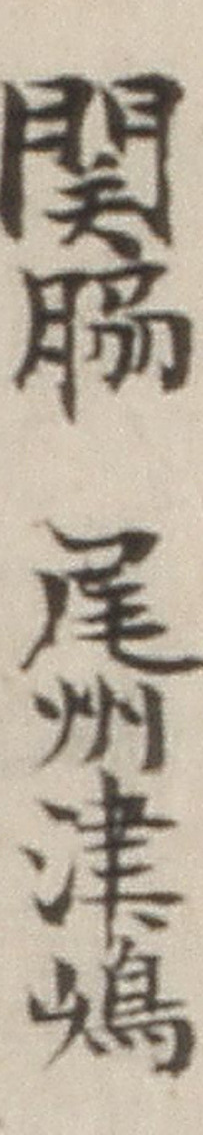関脇尾州津嶋
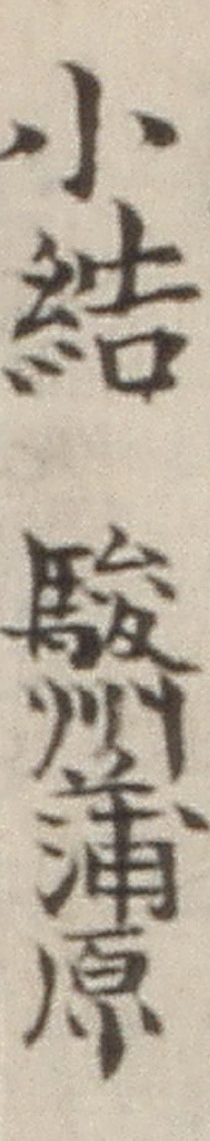小結駿州蒲原
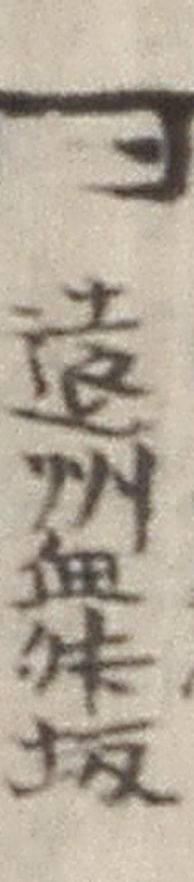同遠州舞坂
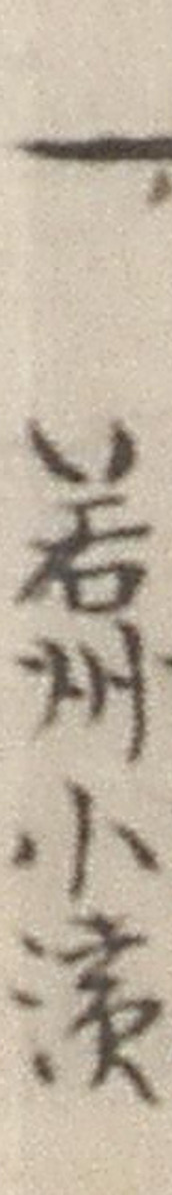同若州小濱
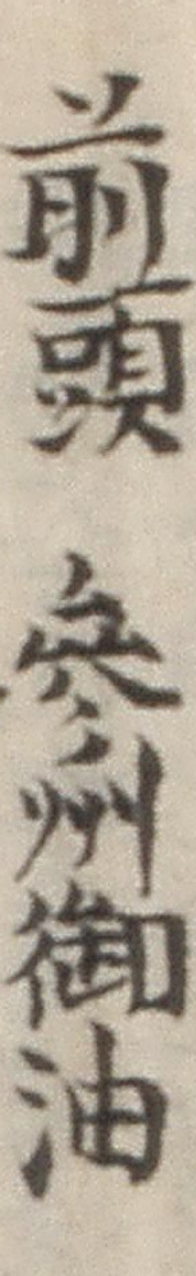前頭参州津
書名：諸國大地震年代記末代噺種
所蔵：東京大学地震研究所図書室 Earthquake Research Institute Library, The University of Tokyo, JAPAN
